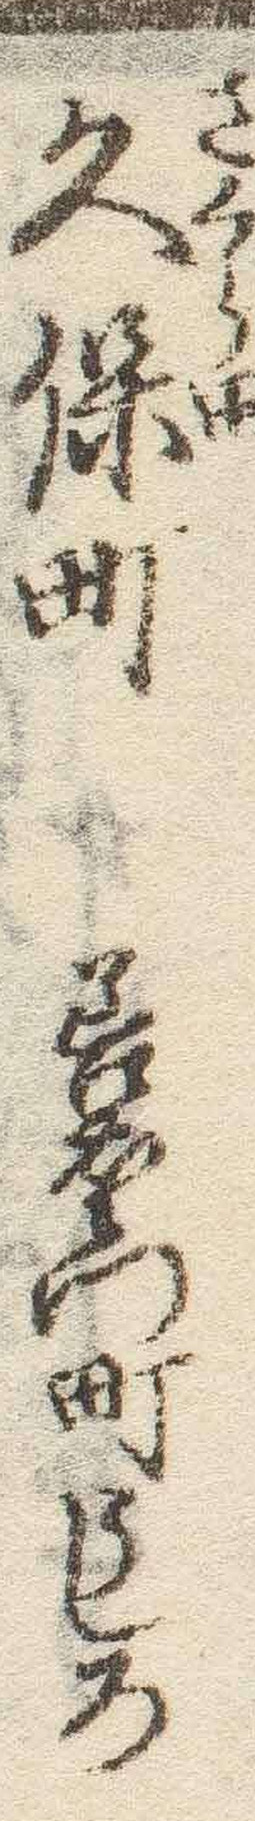久保町善右衛門町うしろ
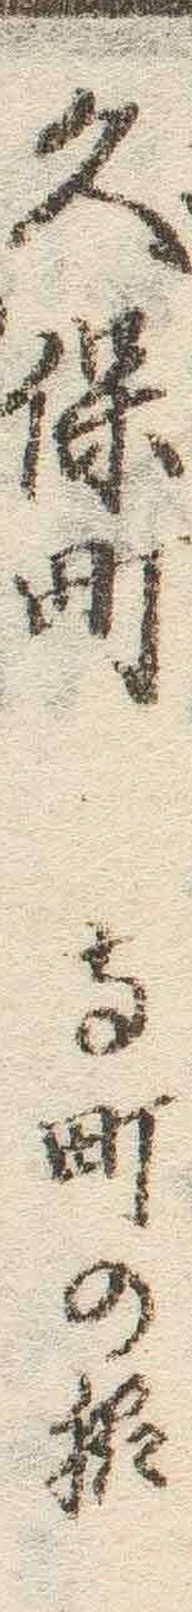久保町寺町の脇
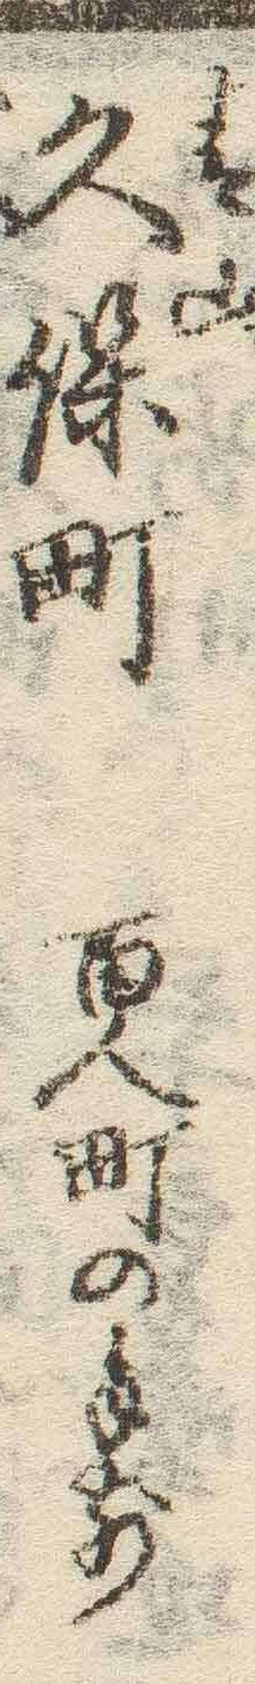久保町百人町の手前
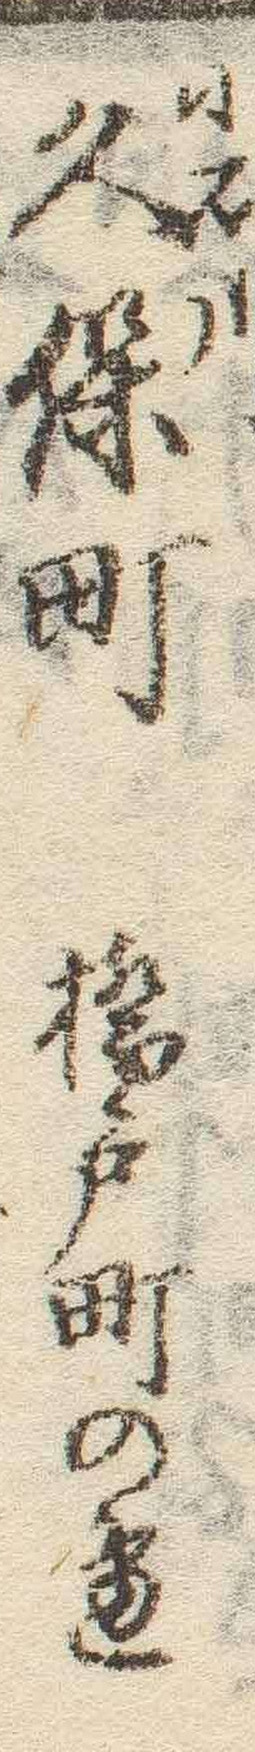久保町橋戸町の辺
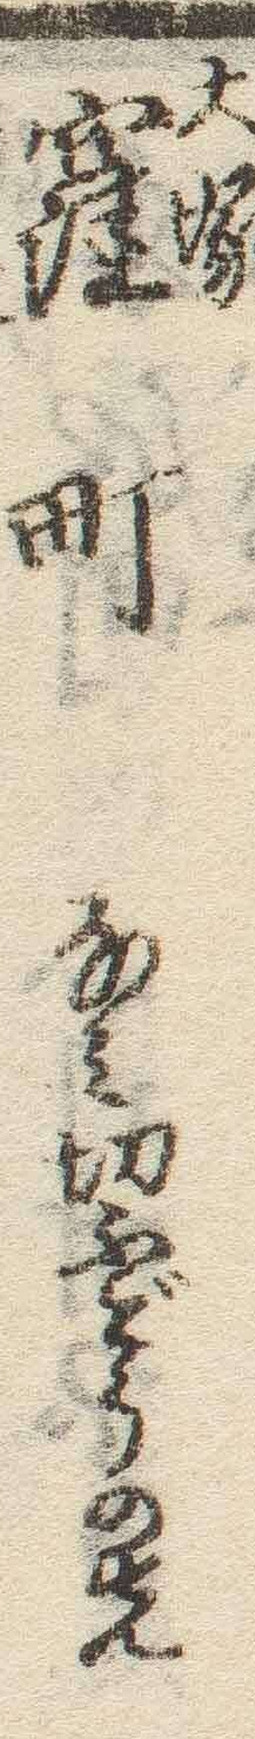窪町なみ切ふどうの先
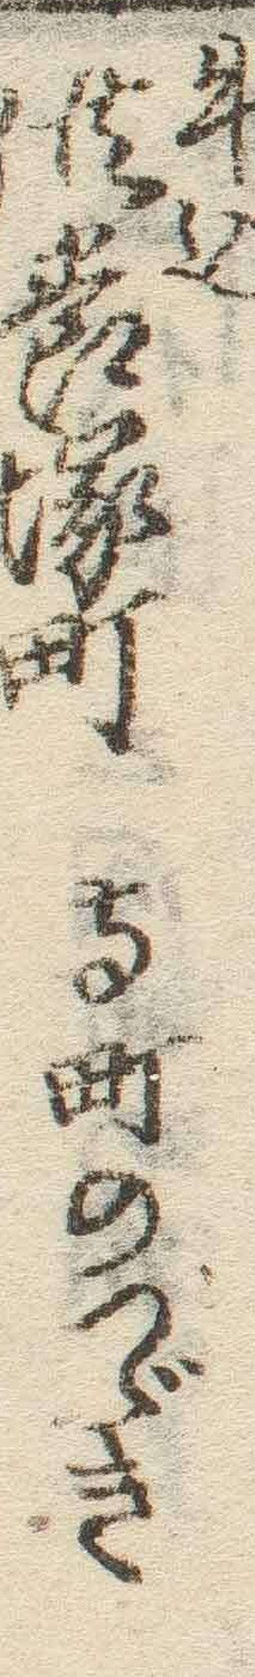供養塚町寺町のつゞき
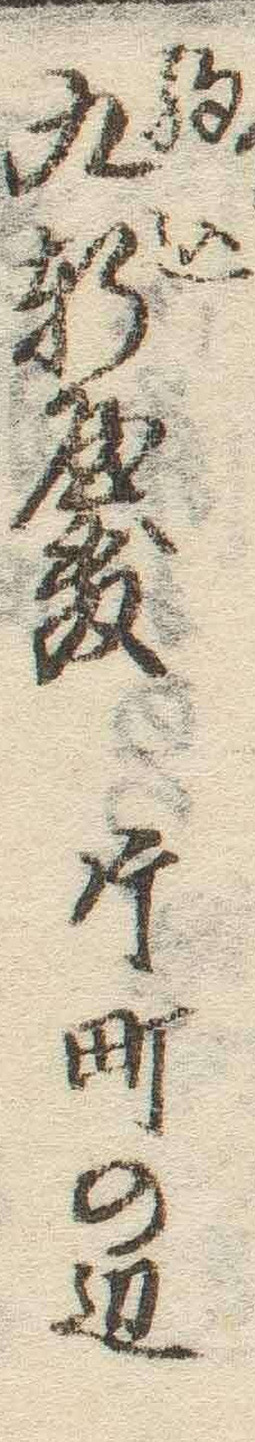九新屋敷片町の辺
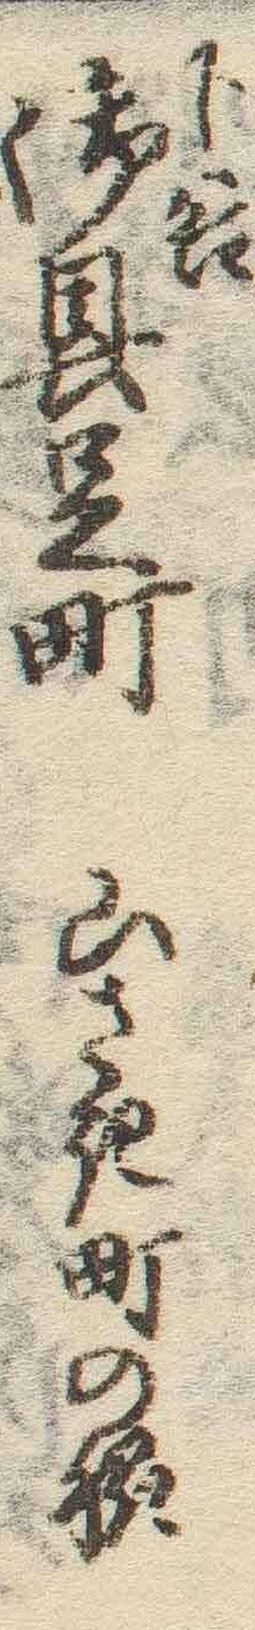御具足町山さき町の脇
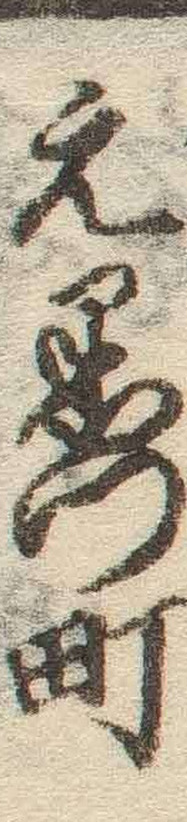元黒門町
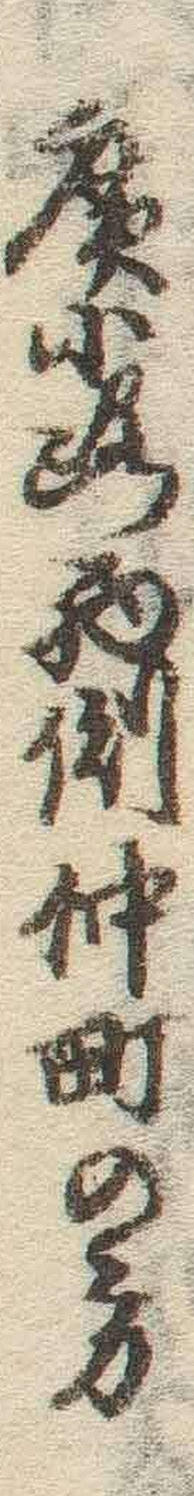広小路西側仲町の方

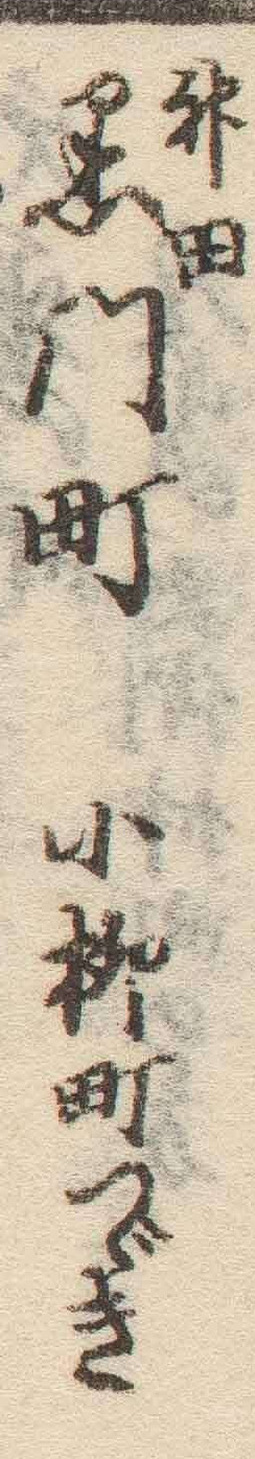黒門町小柳町つゞき
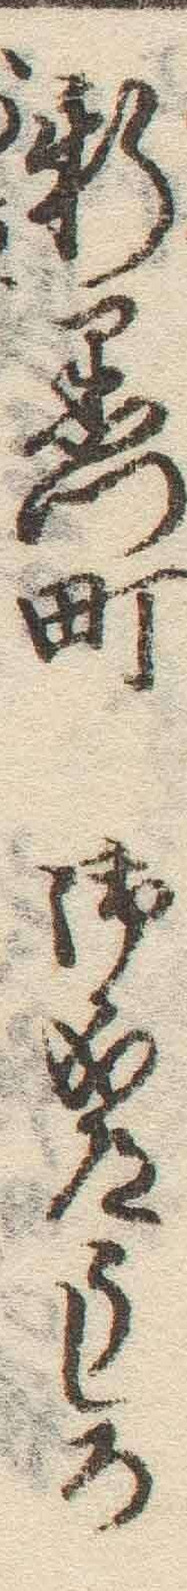新黒門町御成道うしろ
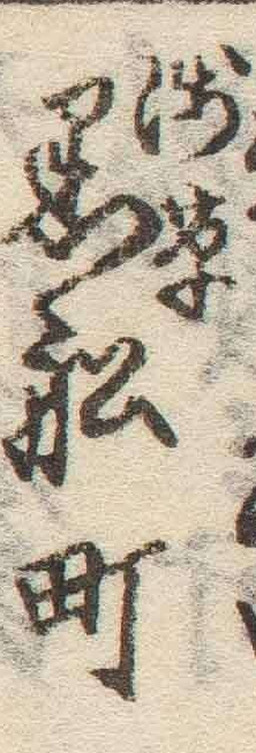黒舩町
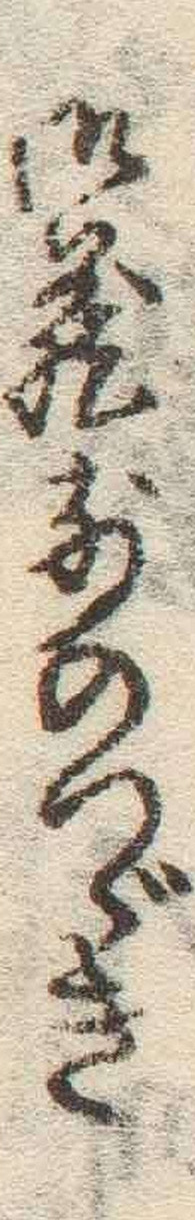御蔵前のつゞき
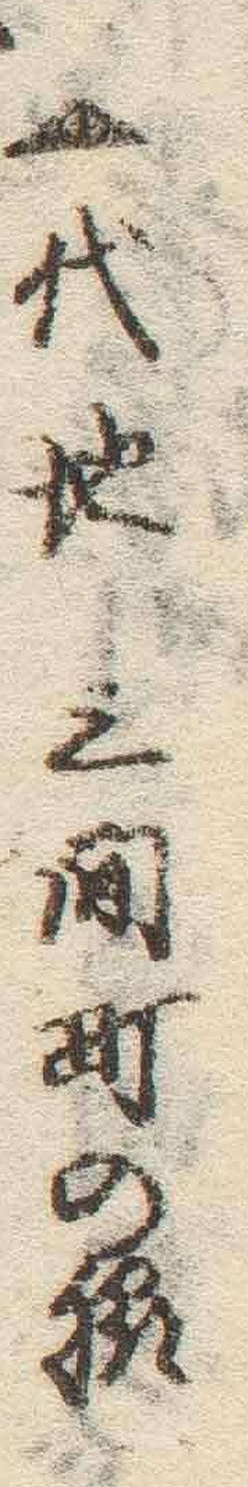▲代地三間町の脇
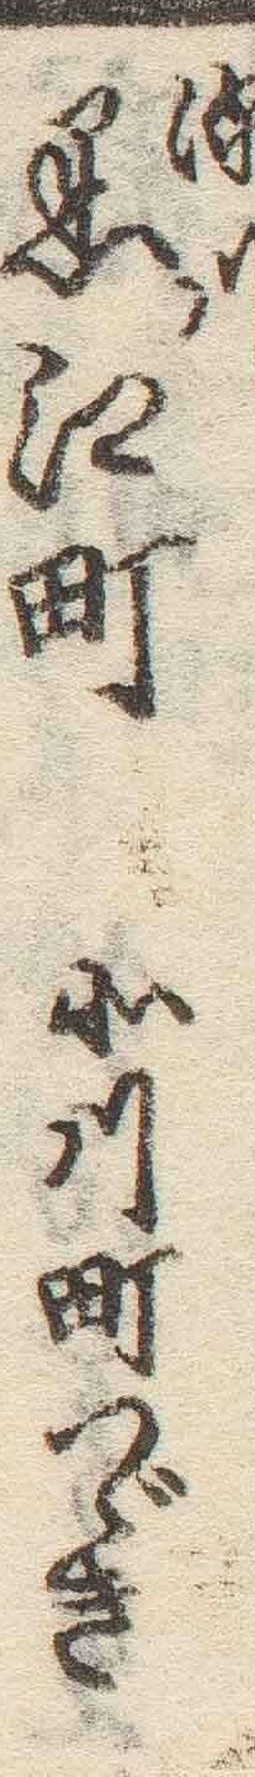黒江町北川町つゞき
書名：江戸町独案内
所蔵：東京学芸大学附属図書館 国文学研究資料館
